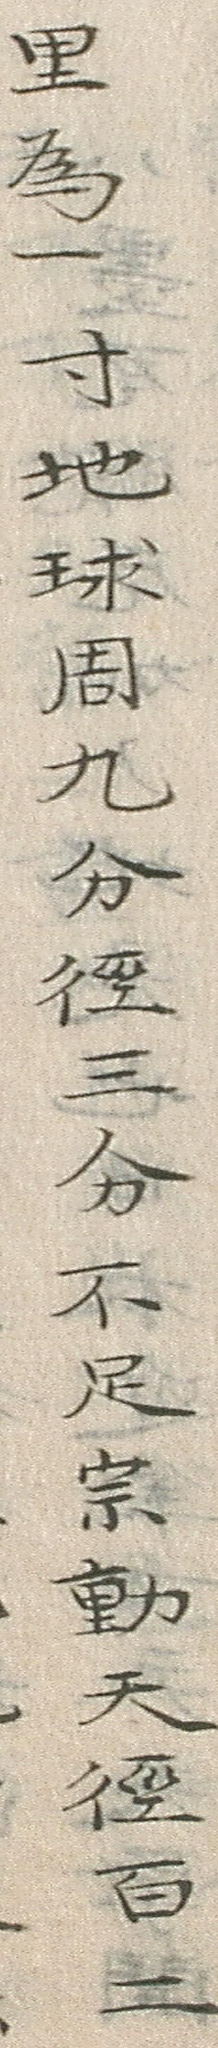里為一寸地球周九分径三分不足宗動天径百二
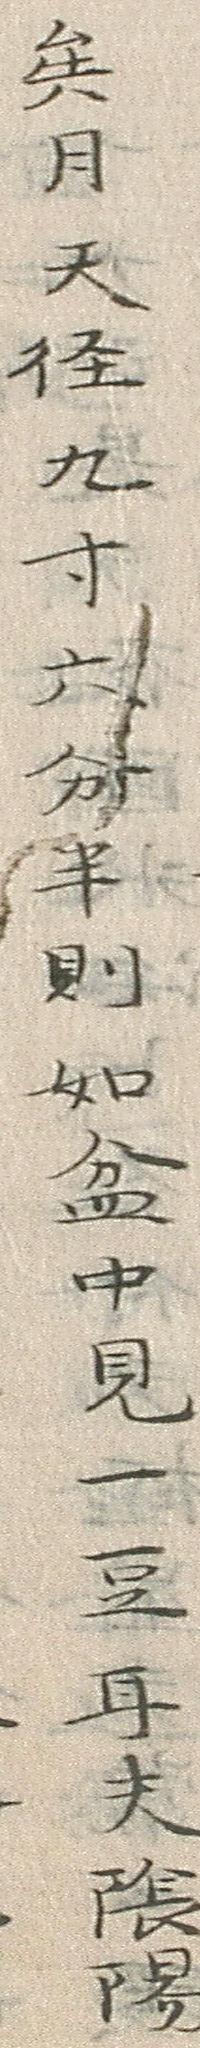矣月天径九寸六分半則如盆中見一豆耳夫陰陽
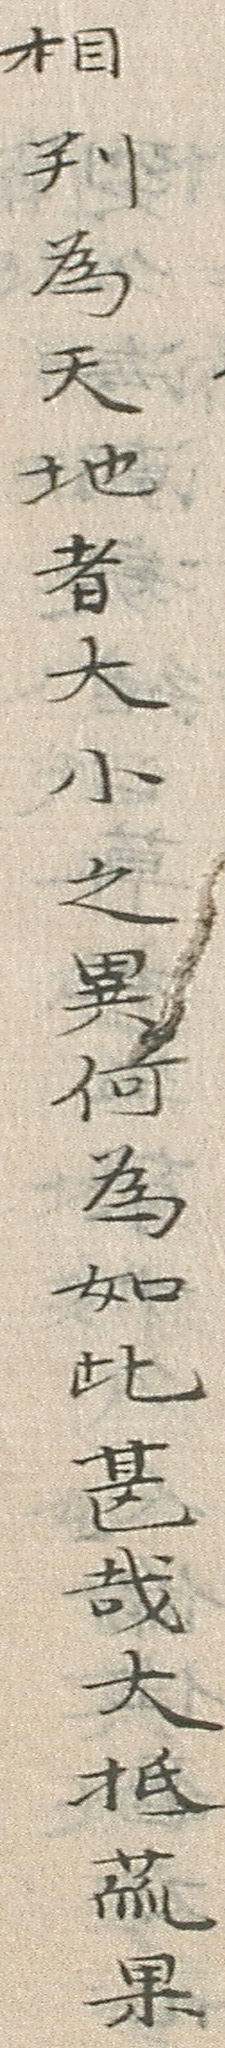相判為天地者大小之異何為如此甚哉大抵菰果
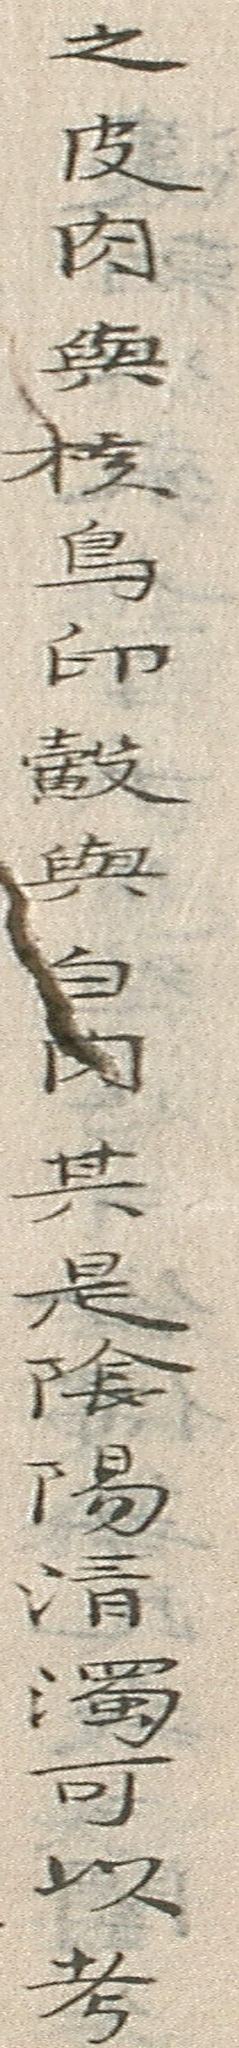之皮肉与核鳥印觳与白肉其是陰陽清濁可以考
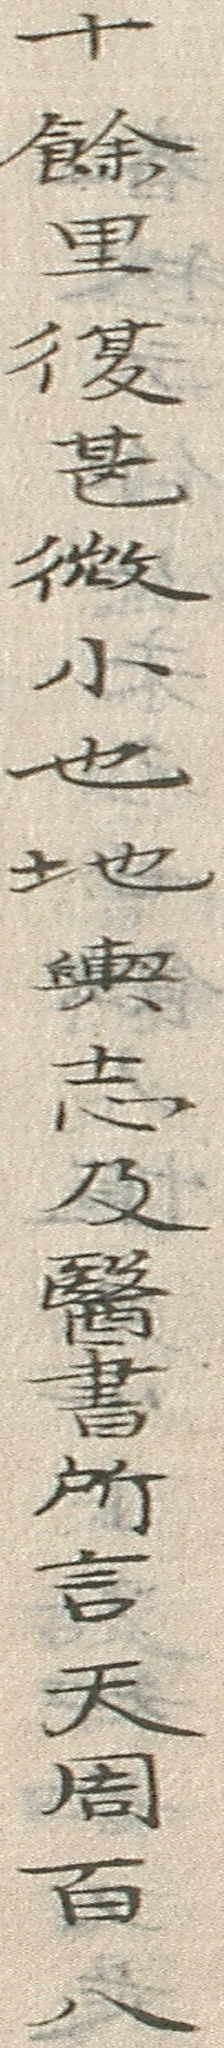十余里復甚微小也地輿志及医書所言天周百八
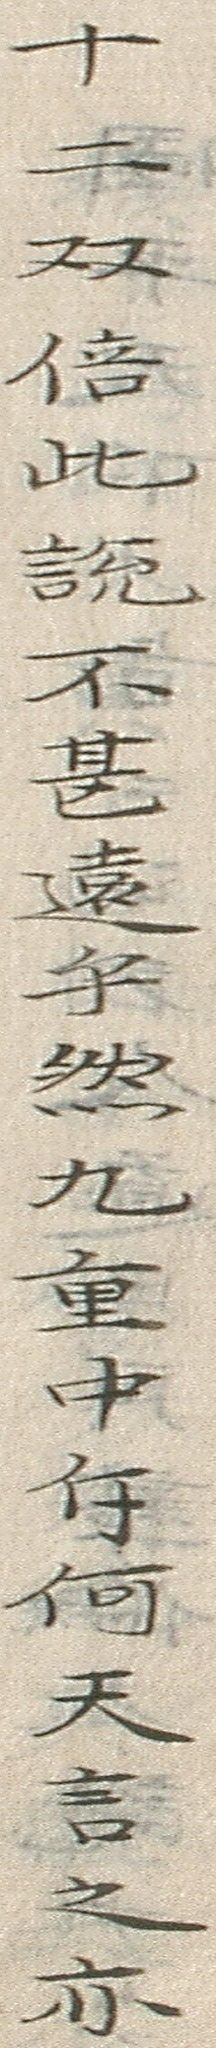十二双倍此説不甚遠乎然九重中斥何天言之亦
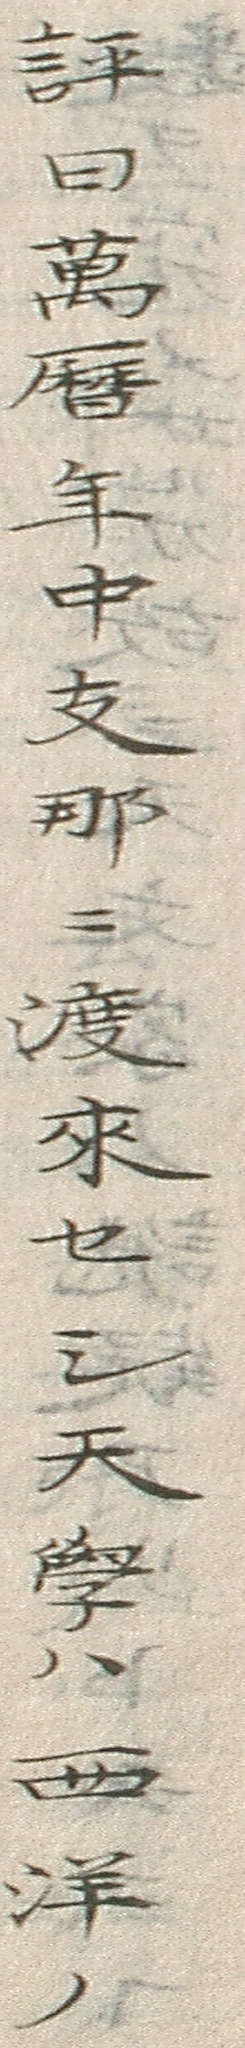評曰万暦年中支那ニ渡来セシ天学ハ西洋ノ
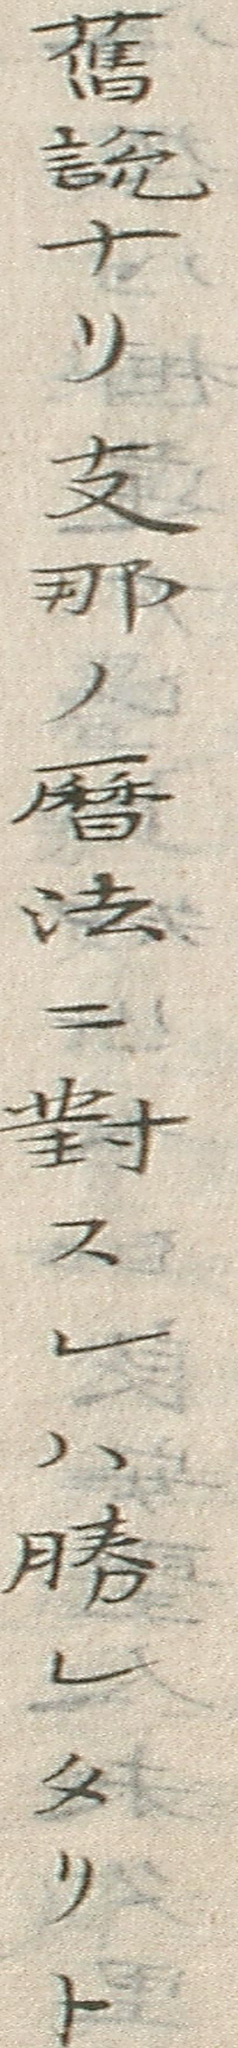旧説ナリ支那ノ暦法ニ対スレハ勝レタリト
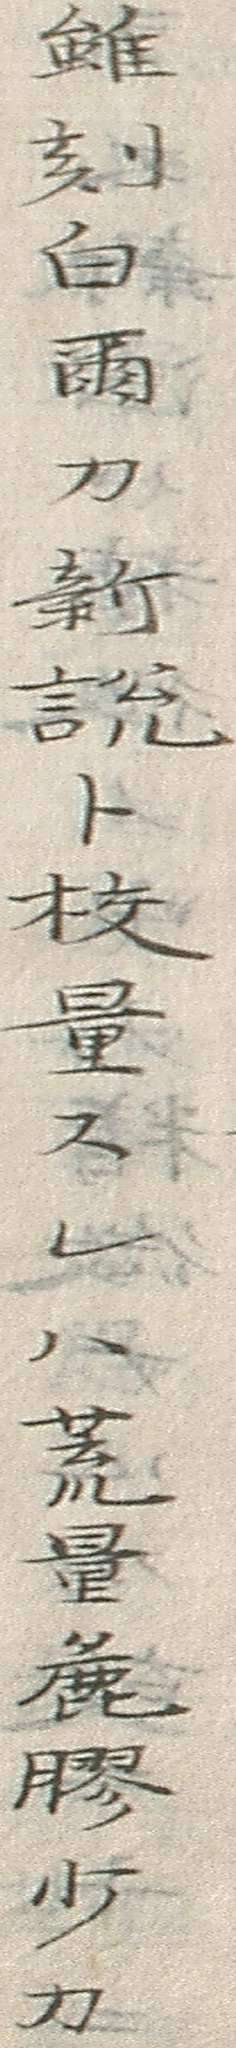雖刻白爾カ新説ト校量スレハ荒量麁膠少カ

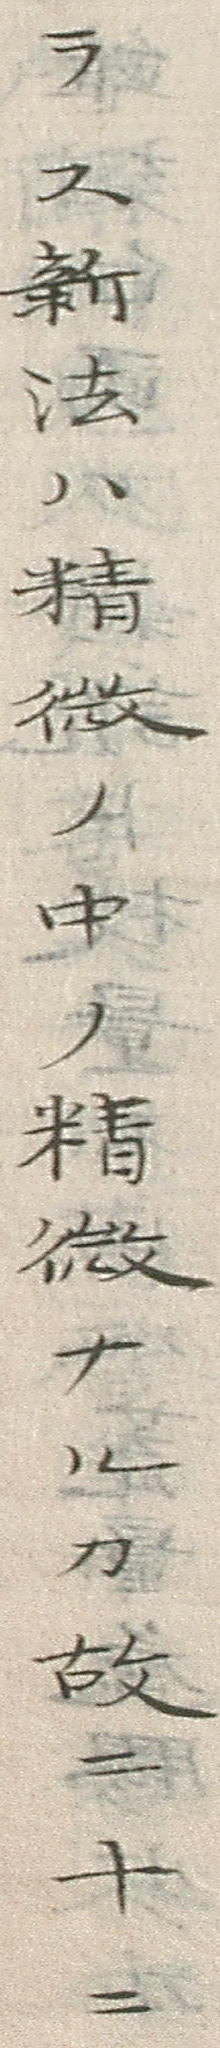ラス新法ハ精微ノ中ノ精微ナルカ故ニ十ニ
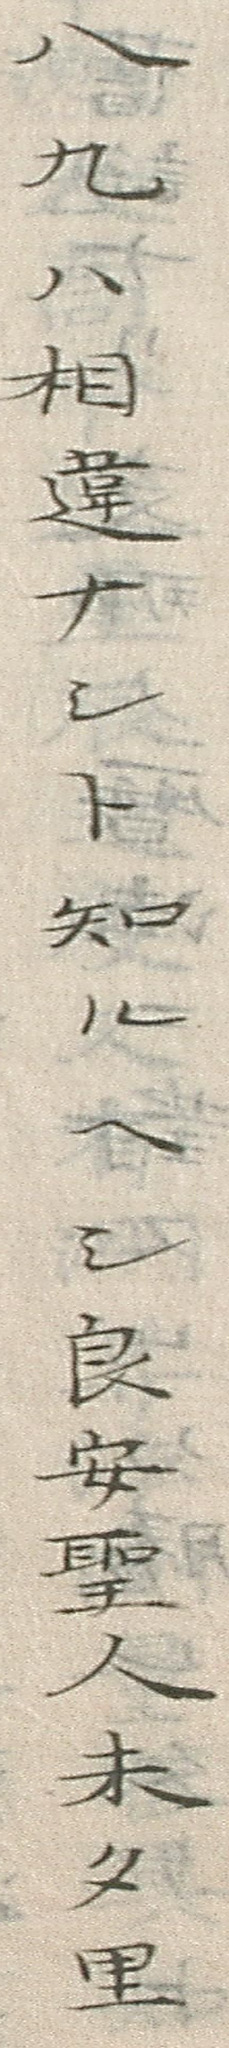八九ハ相違ナシト知ルヘシ良安聖人未タ里
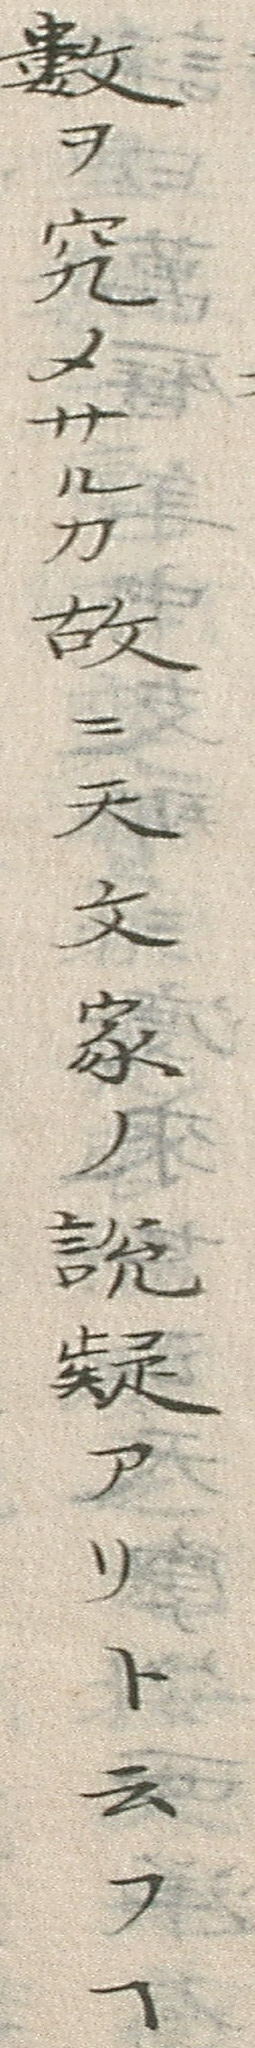数ヲ究メサルカ故ニ天文家ノ説疑アリト云フコト
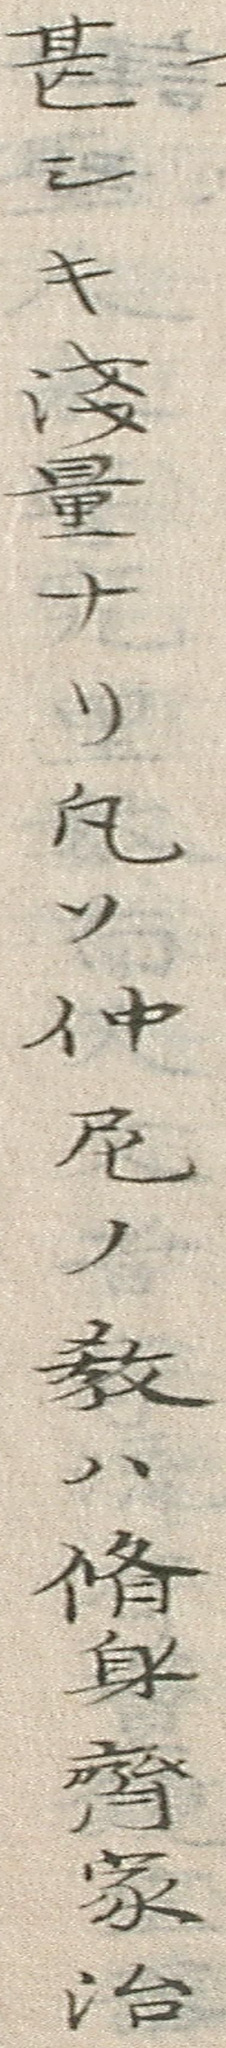甚シキ浅量ナリ凡ソ仲尼ノ教ハ修身齋家治
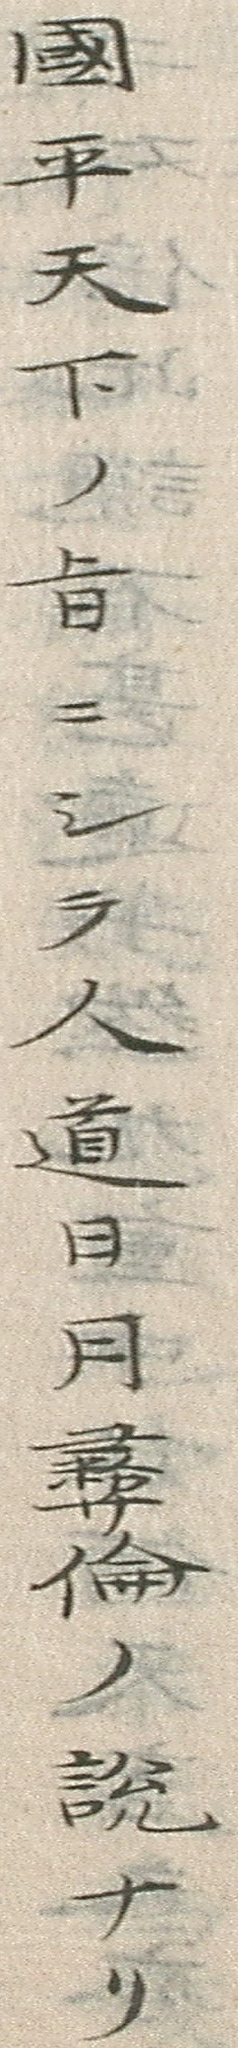国平天下ノ旨ニシテ人道日月彛倫ノ説ナリ
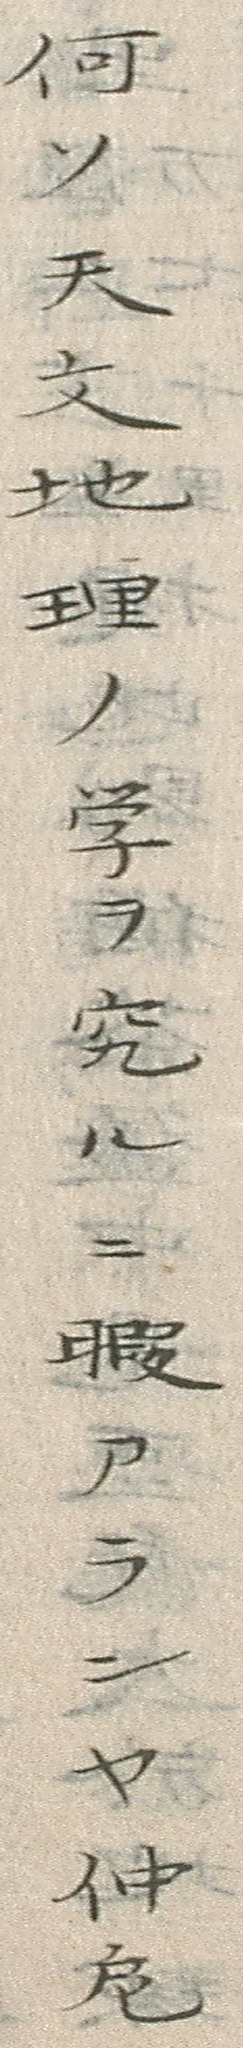何ソ天文地理ノ学ヲ究ルニ暇アランヤ仲尼
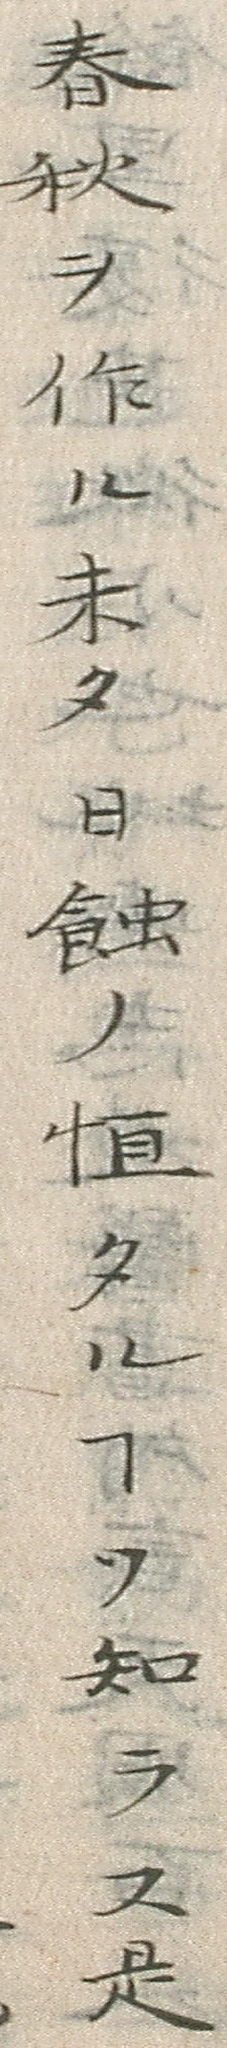春秋ヲ作ル未タ日蝕ノ恒タルコトソ知ラス是
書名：天學略名目羽翼　全
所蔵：東京大学地震研究所図書室 Earthquake Research Institute Library, The University of Tokyo, JAPAN
